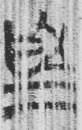爲
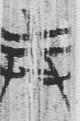奉
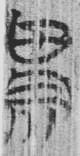○（鬼）
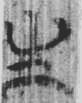生
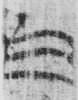於
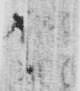人
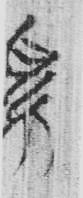○（奚）
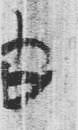古（故）
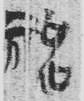神
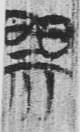○（明）
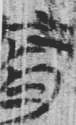骨
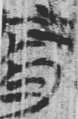肉
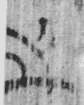之
